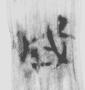成
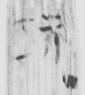{示工}
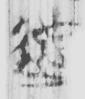{辶皮}
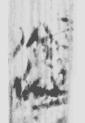{辶㡀}
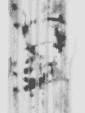軍
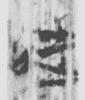徒
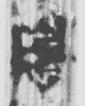茖
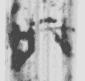亓
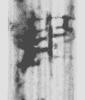車
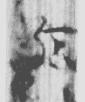價
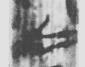㠯（以）
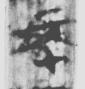不
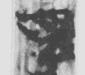𠭁
